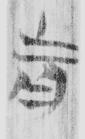歬
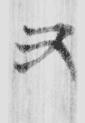又
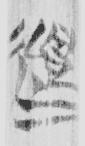道
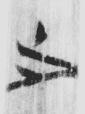之
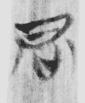君
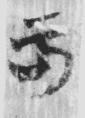可
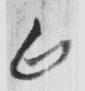㠯（以）
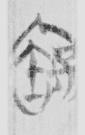{宀缶呆}
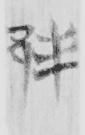邦
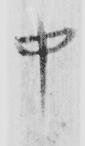中
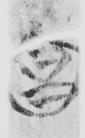合
